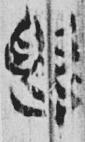受
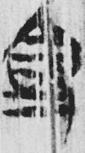命
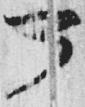乃
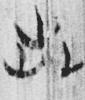卉
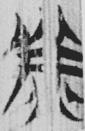備（服）
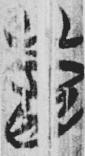○（箁）
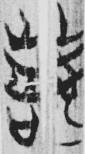○（箬）
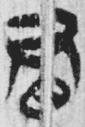冒（帽）
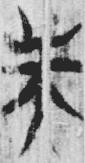芙
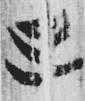疋
